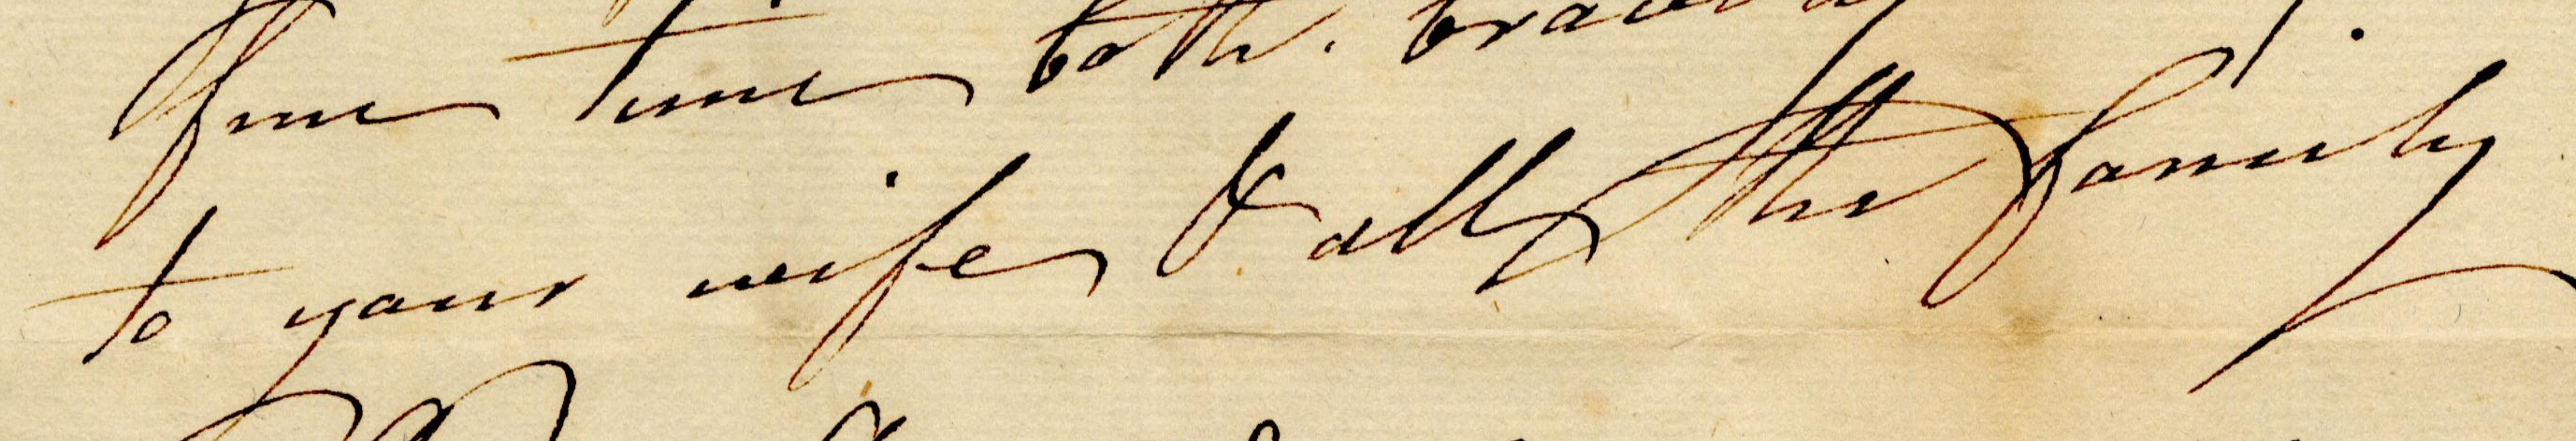to your wife & all the family
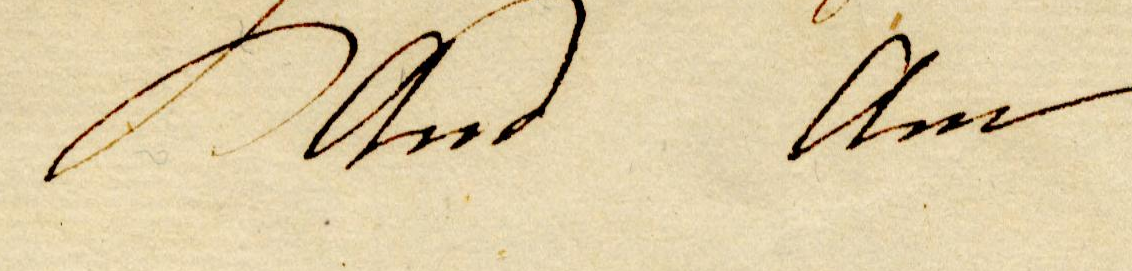and am
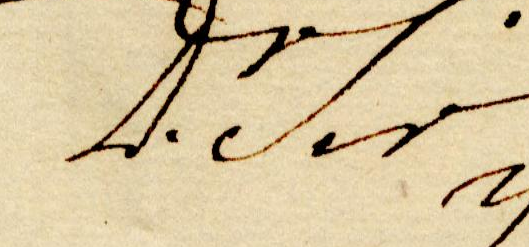D^r Sir
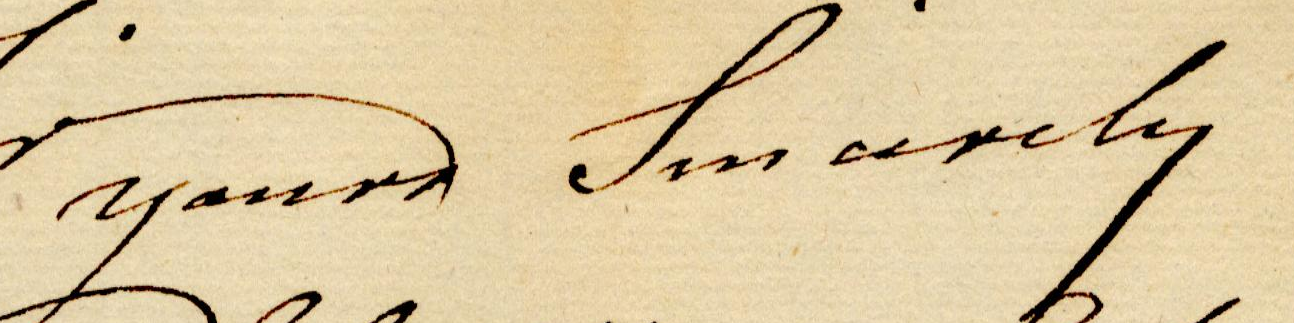yours Sincerely
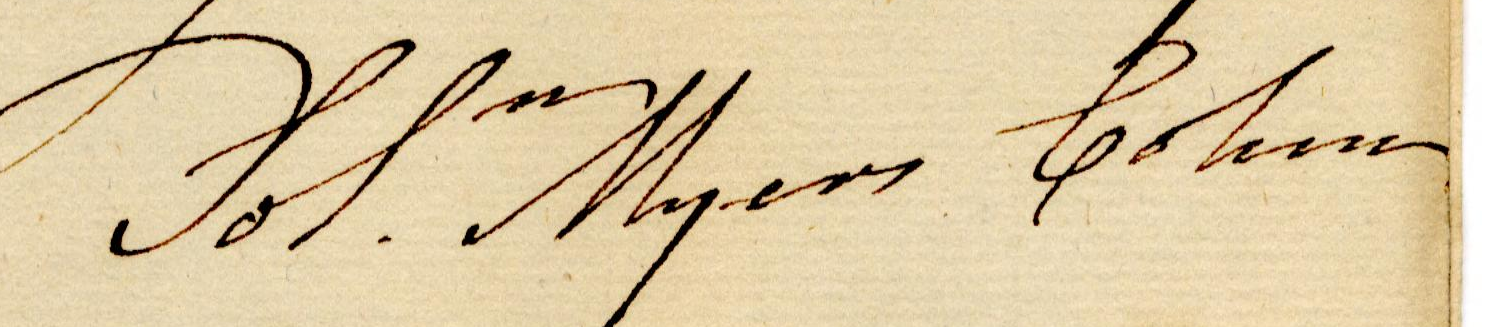Sol^n. Myers Cohen
